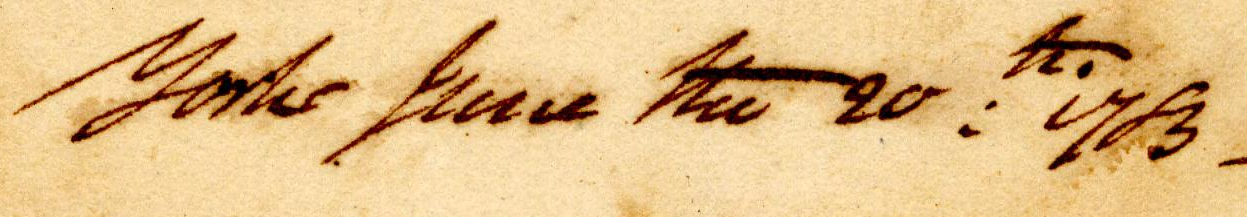York June the 20^th: 1783
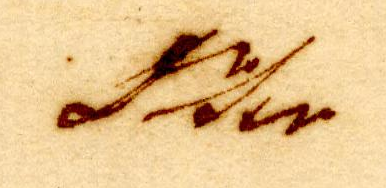D^r Sir
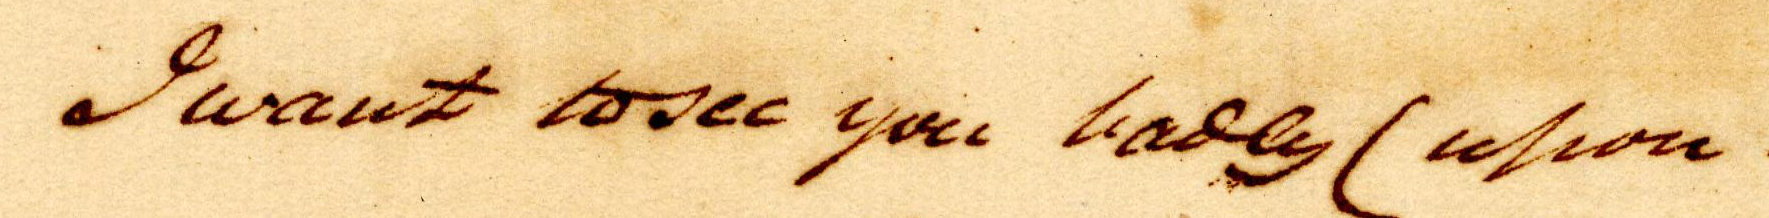I want to see you badly (upon
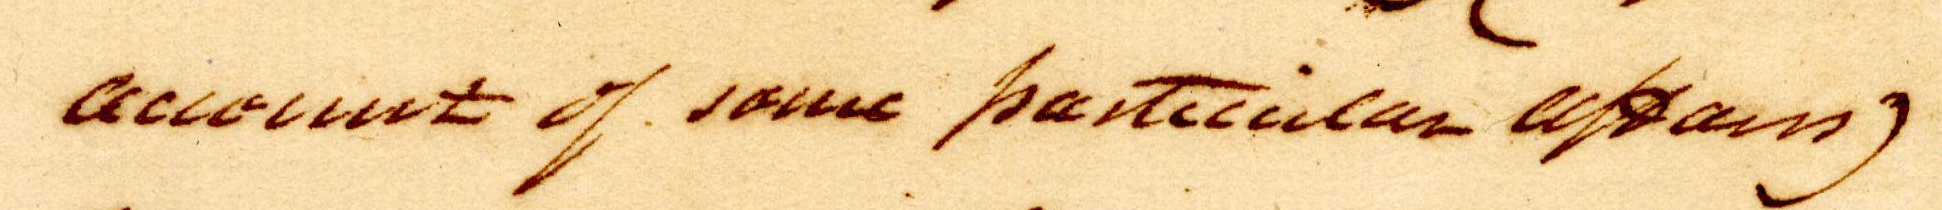account of some particular Affairs)
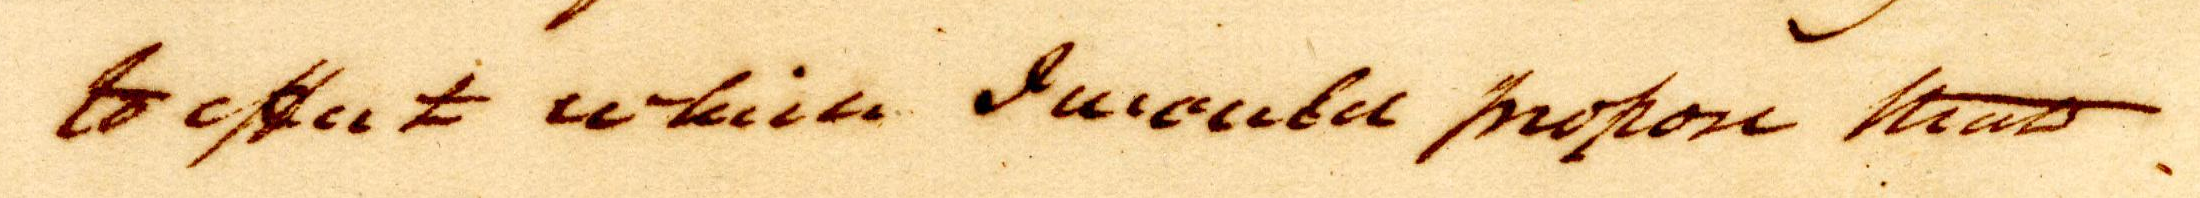to effect which I uccube propose that
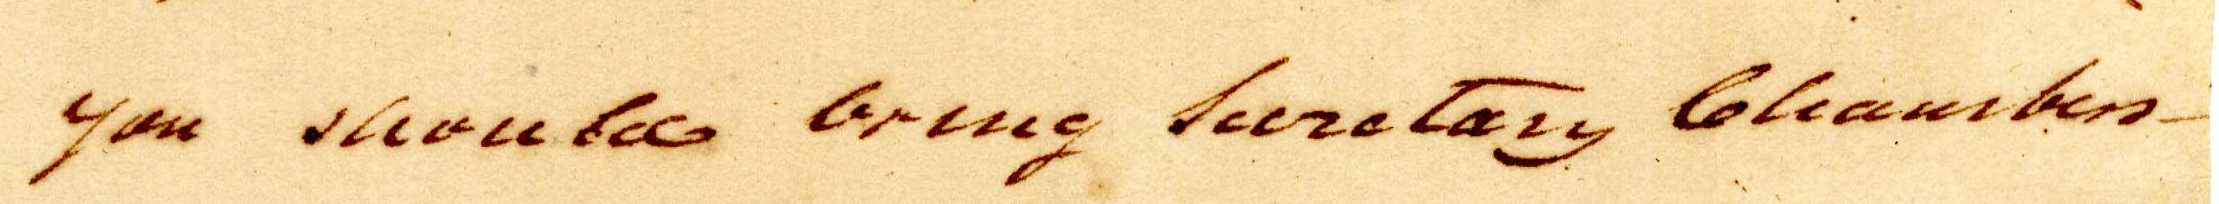you should bring Secretary Chambers
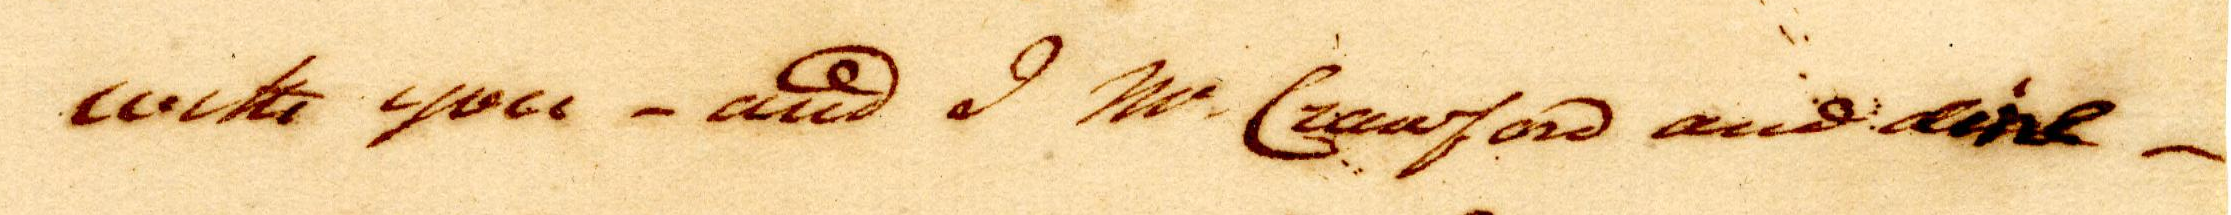with you- and I M^r. Crawford and dine-
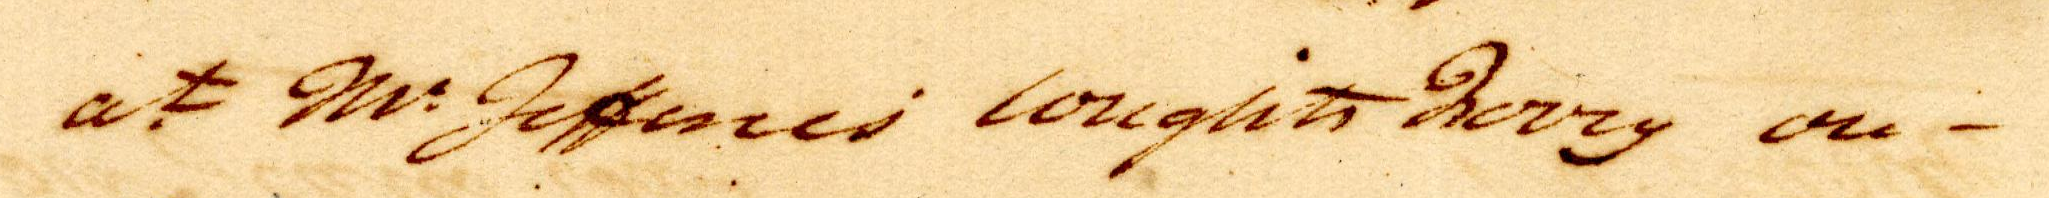at M^. Jefferies Wrights Ferry on
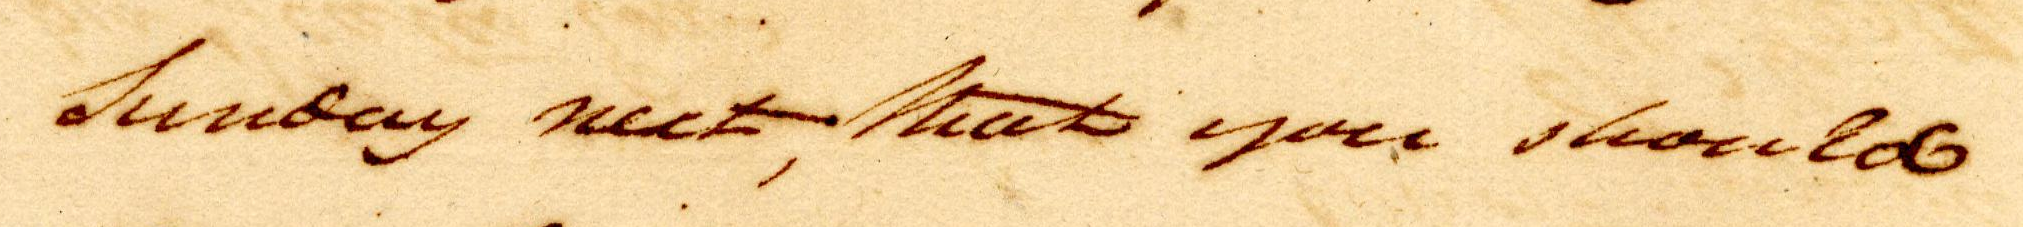Sunday next, that you should
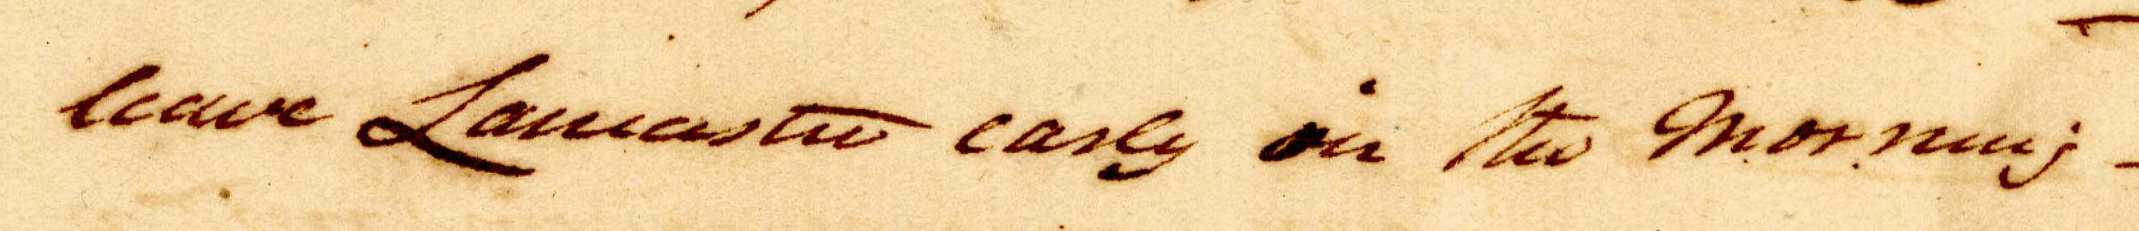leave Lancaster early on the Morning
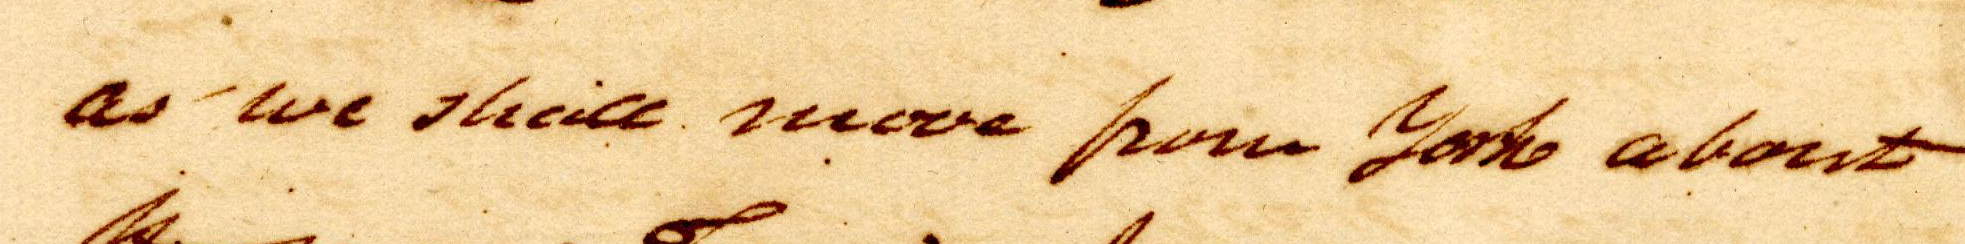as we shall move from York about
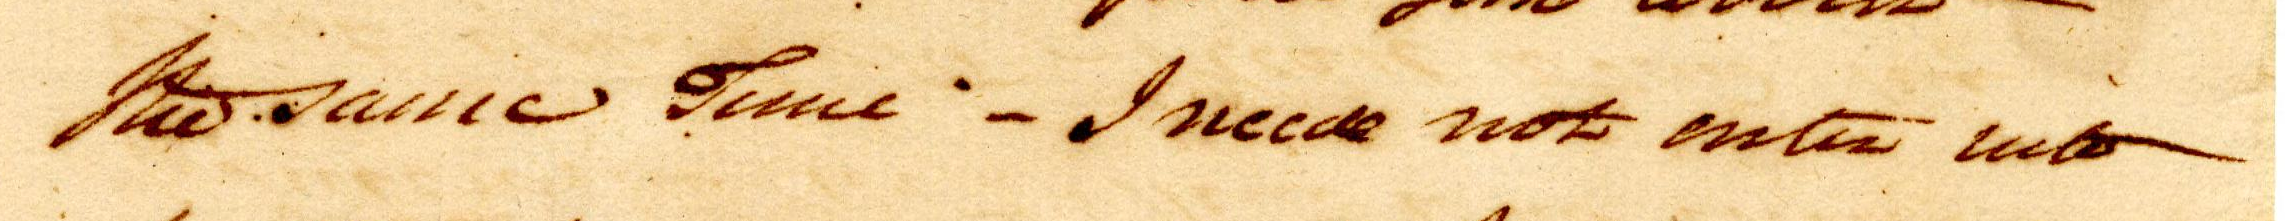the same Time- I need not enter into
